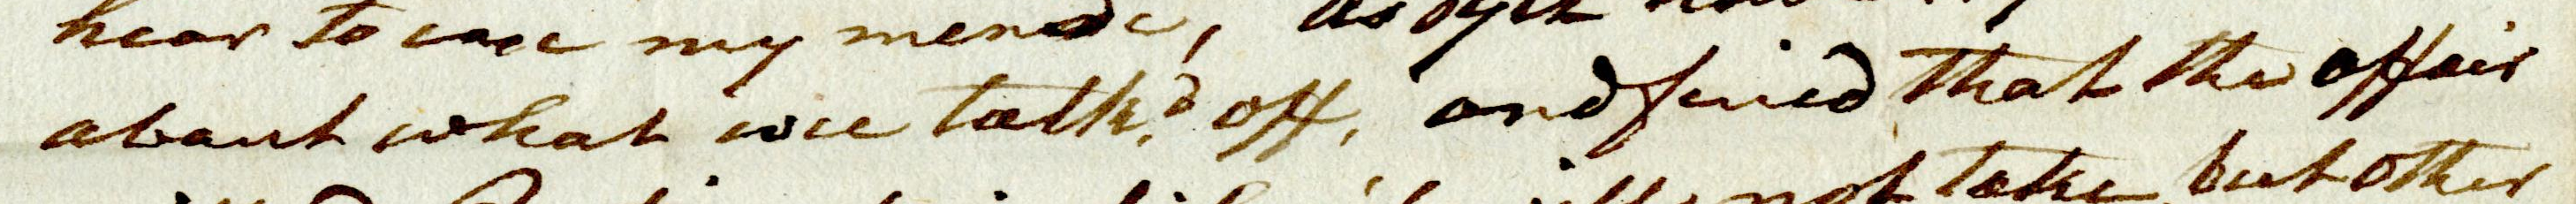about what wee talk^d off, and find that the affair
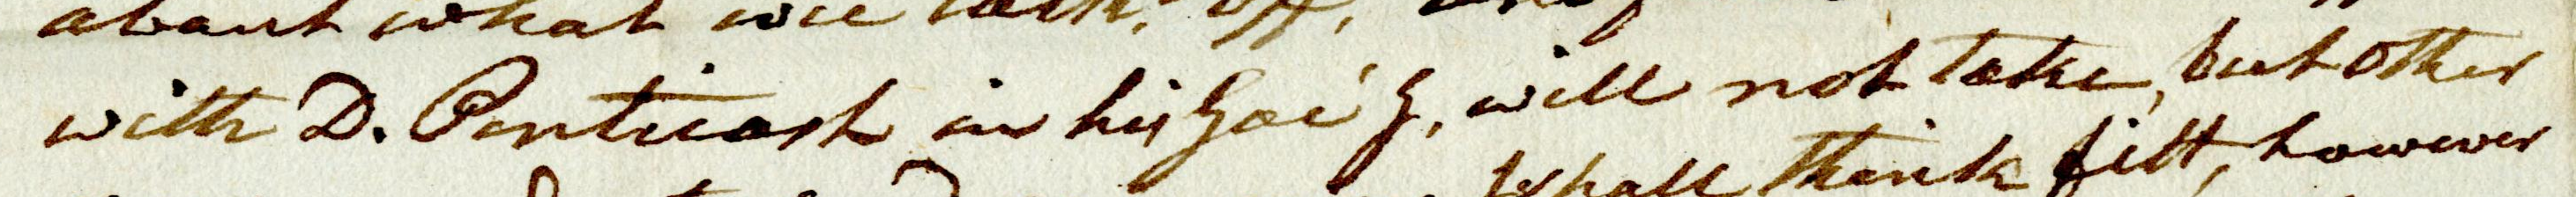with D. Penticast in his Goe'g. will not take, but other
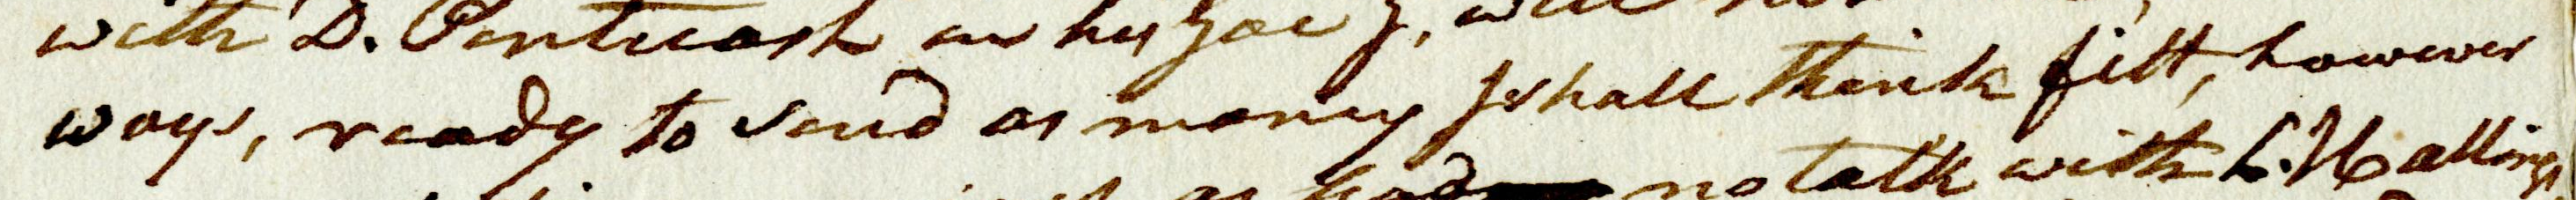ways, ready to send as money I shall think fitt, however
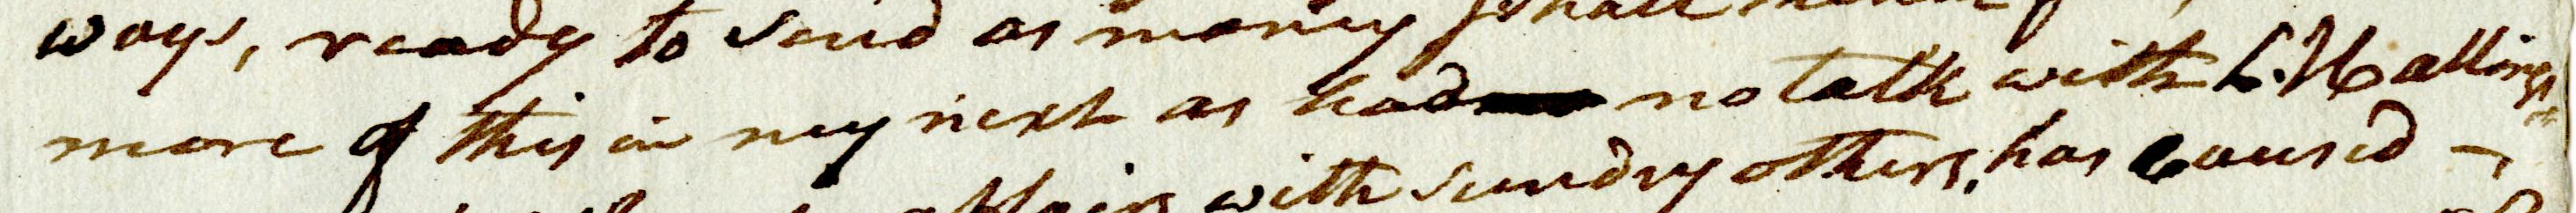more of this a my next as had [__] no talk with C. Hallings-
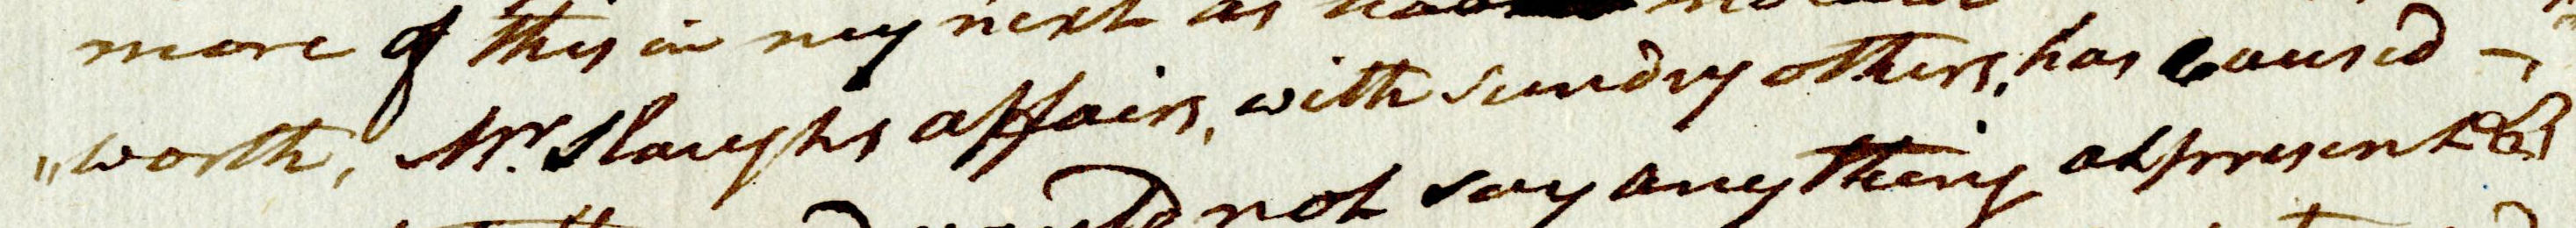-worth, M^r Slaughs affairs, with sundry others has caused-
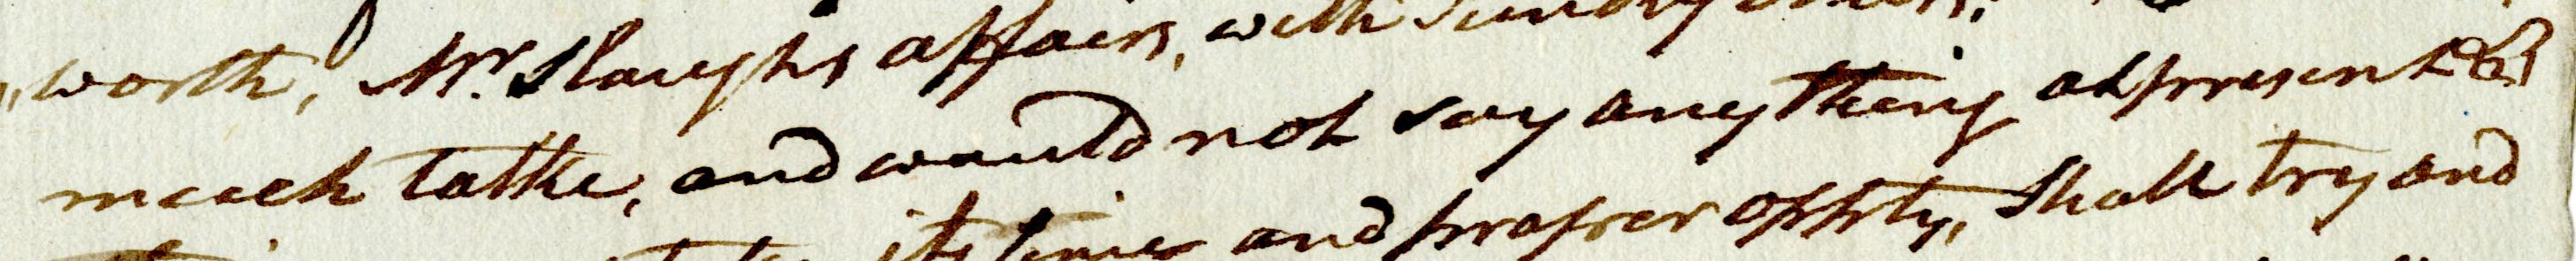much talke, and would not say any thing at present [__]
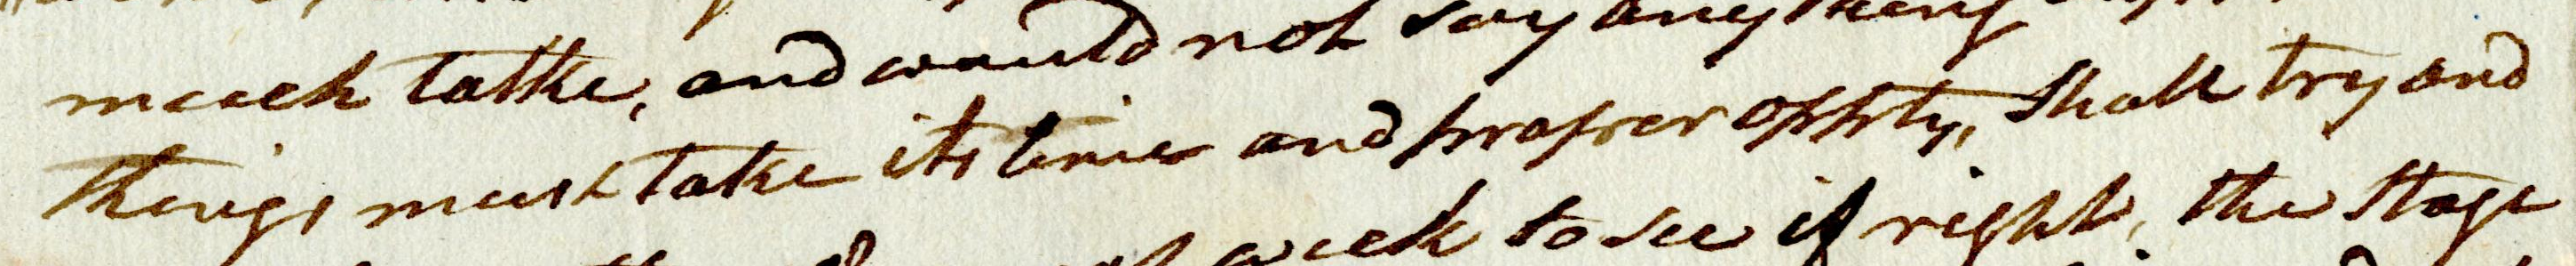things must take its time and proper oppty, shall try and
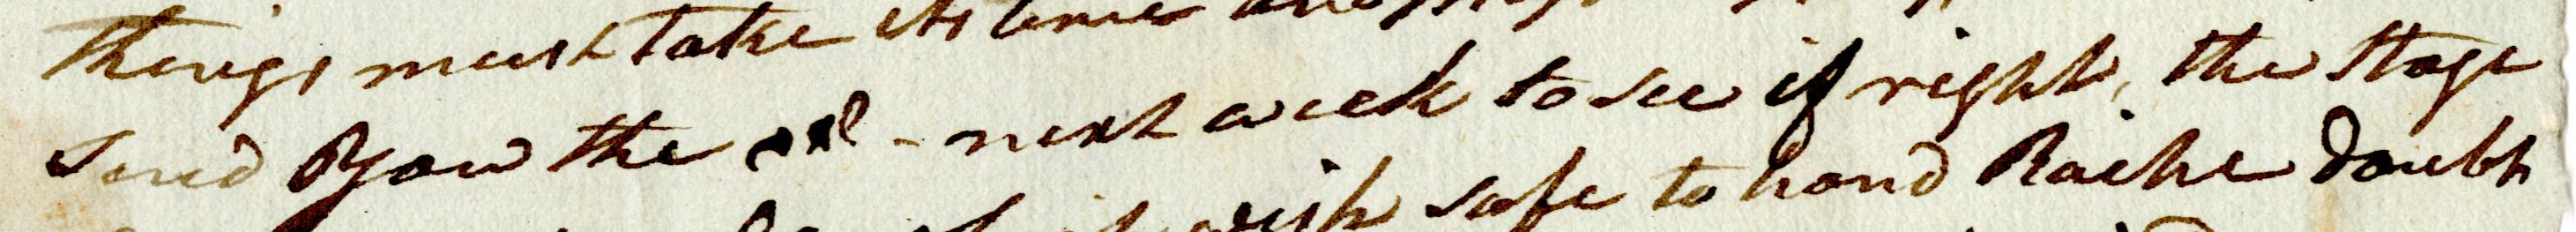send you the [___]- next week to see if right. the stage
